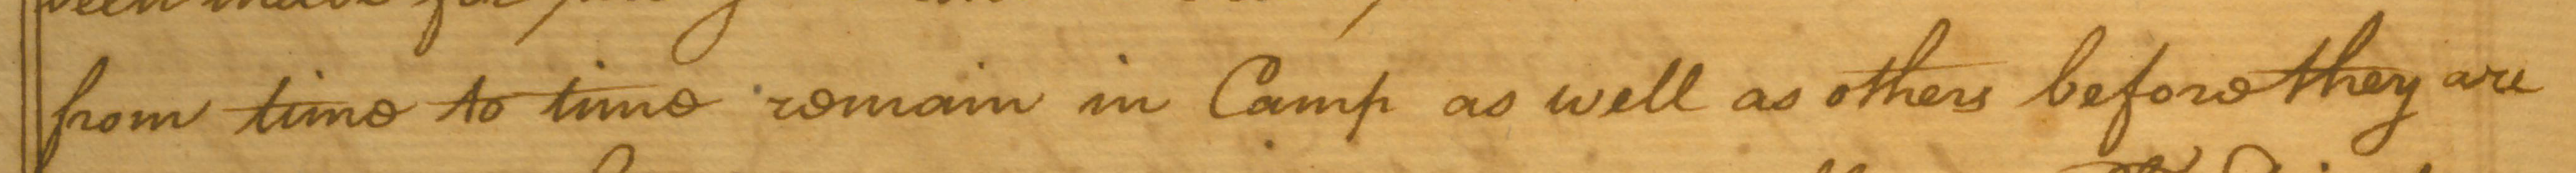from time to time remain in Camp as well as others before they are
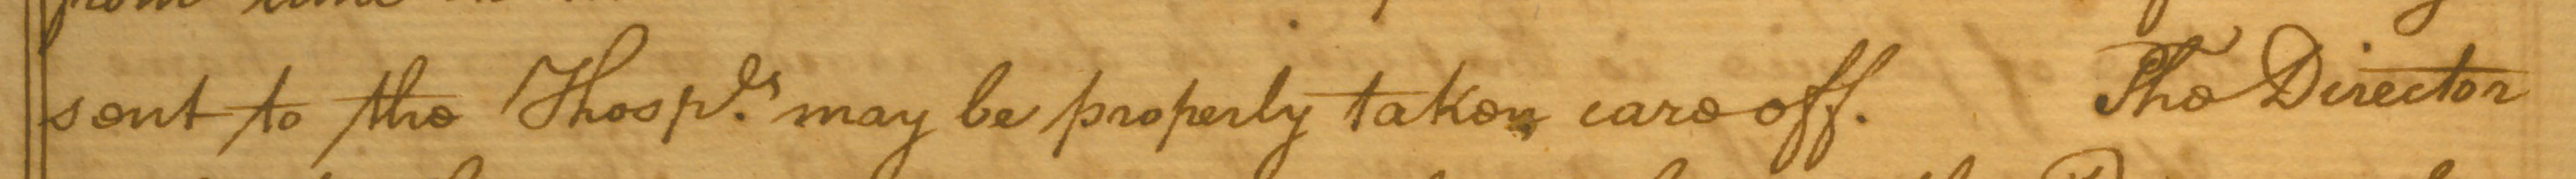sent to the Hosp^ls. may be properly taken care off. The Director
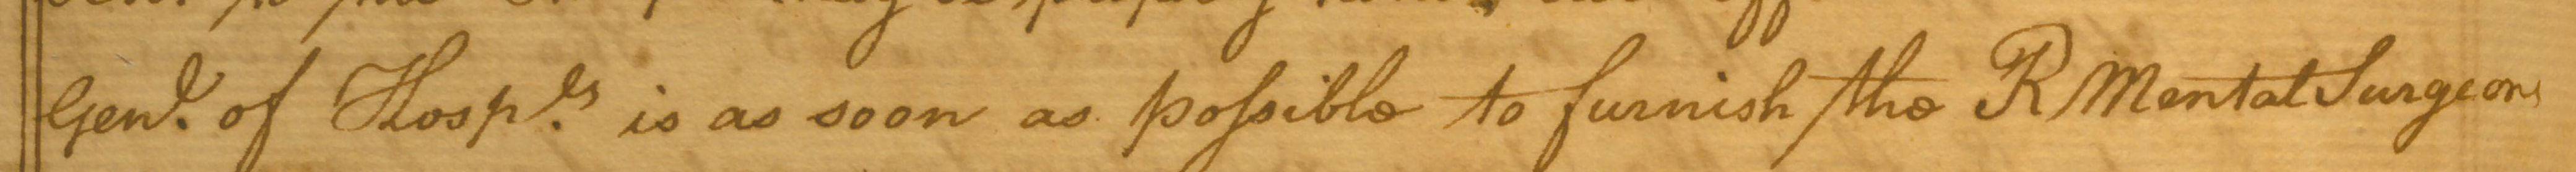Gen^l. of Hosp^ls. is as soon as possible to furnish the R Mental Surgeons
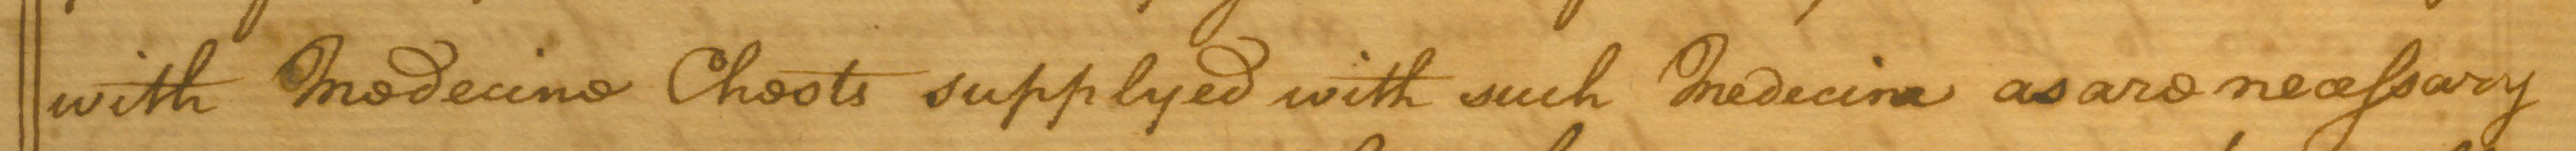with medecine Chests supplyed with such medicine as are necessary
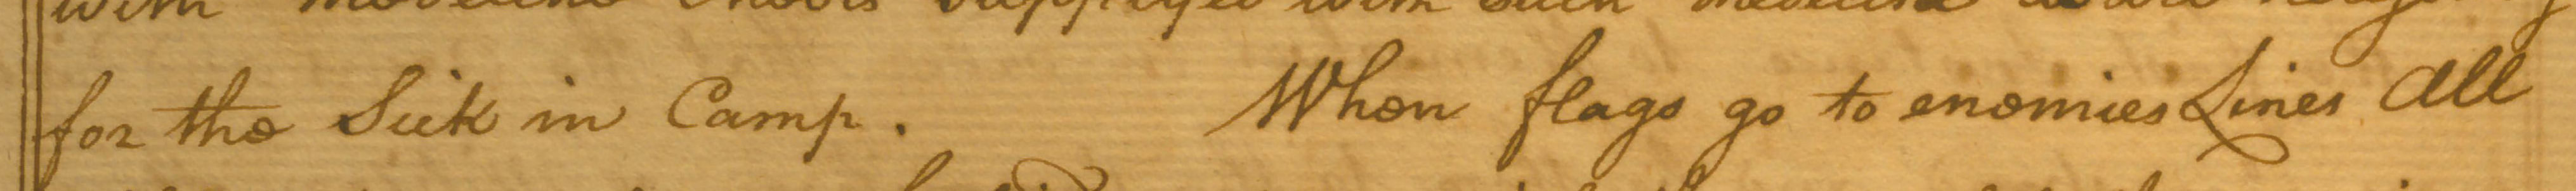for the Sick in Camp. When flags go to enemies Lines All
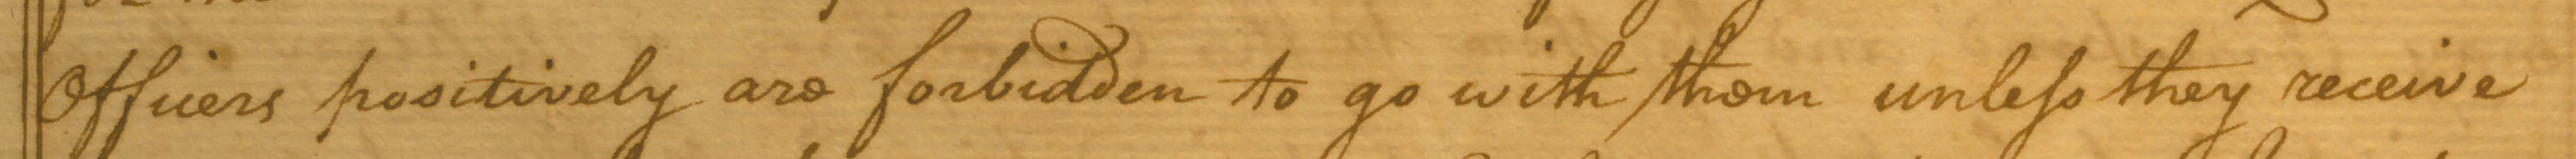Officers positively are forbidden to go with them unless they receive
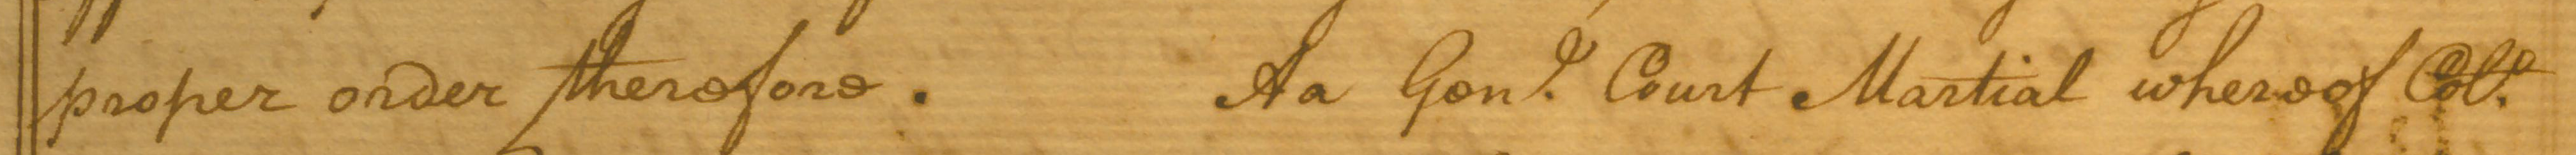proper order therefore. Aa Gen^l. Court Martial whereof Col^o.
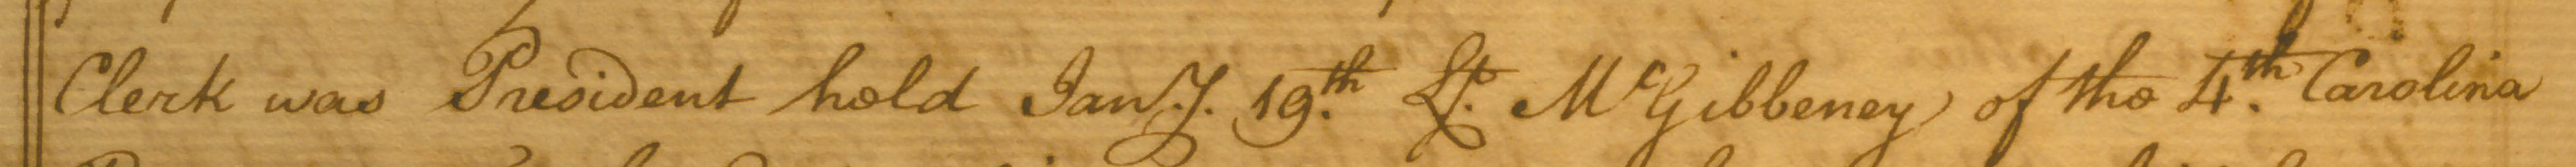Clerk was President held Jan^y. 19^th. L^t. M^cGibbeney of the 4^th. Carolina
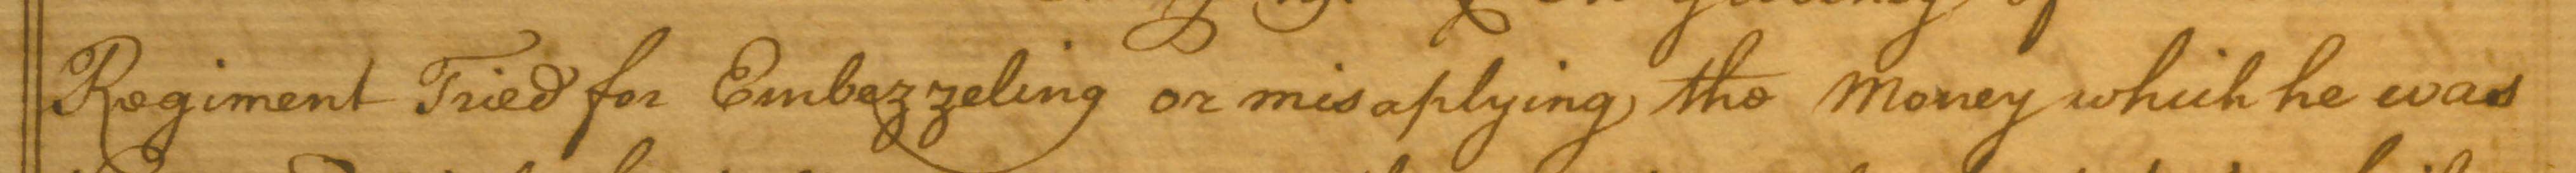Regiment Tried for Embezzeling or misapplying the money which he was
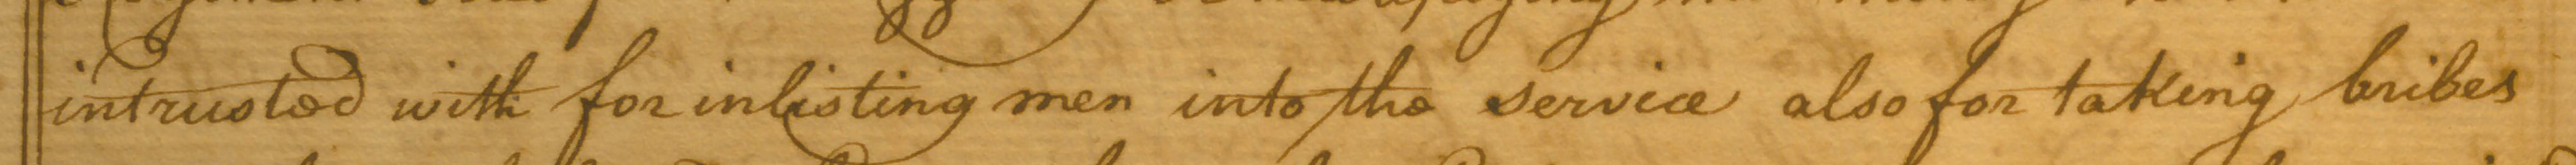intrusted with for inlisting men into the service also for taking bribes
